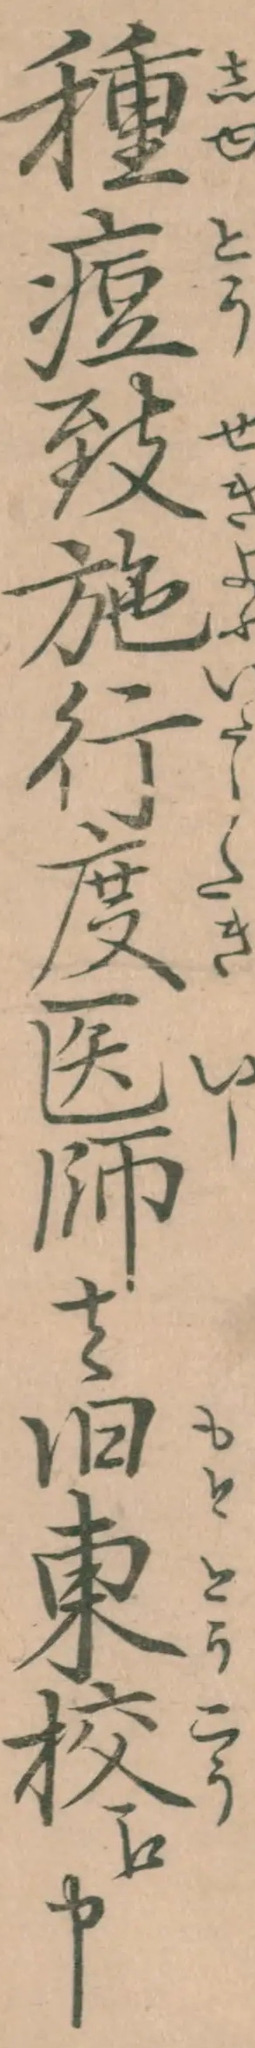種痘致施行度医師は旧東校迄申
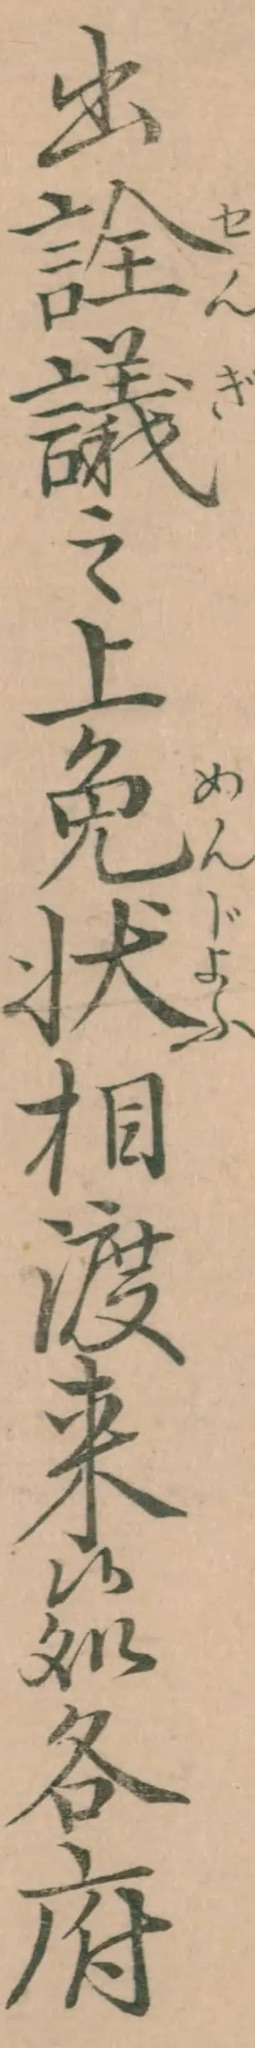出詮議之上免状相渡来候処各府
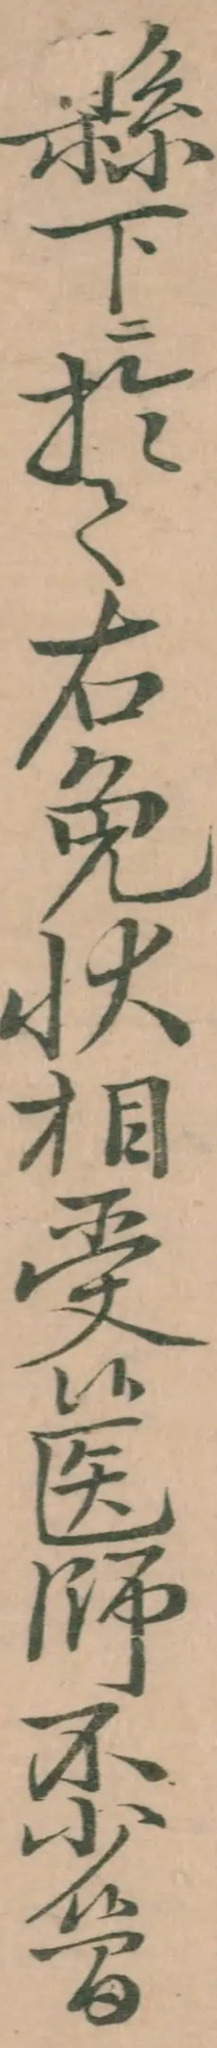県下に於て右免状相受候医師不少候間
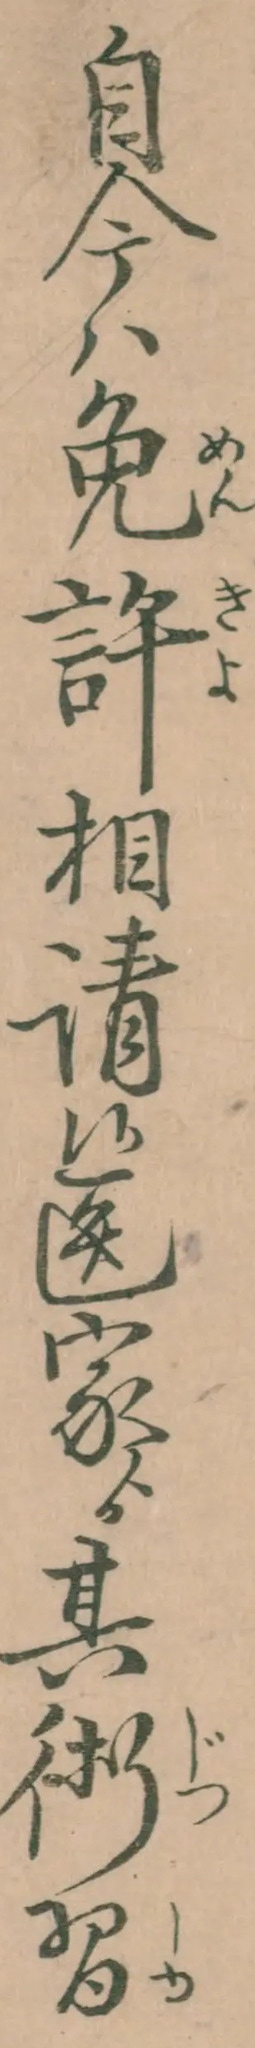自今は免許相請候医家ゟ其術習
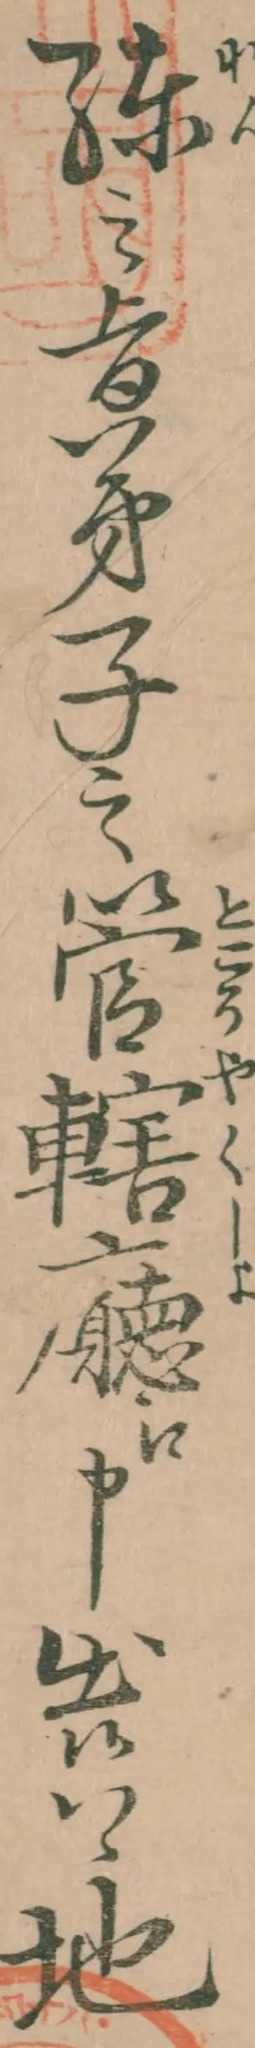練之旨弟子之管轄庁に申出候はゝ地
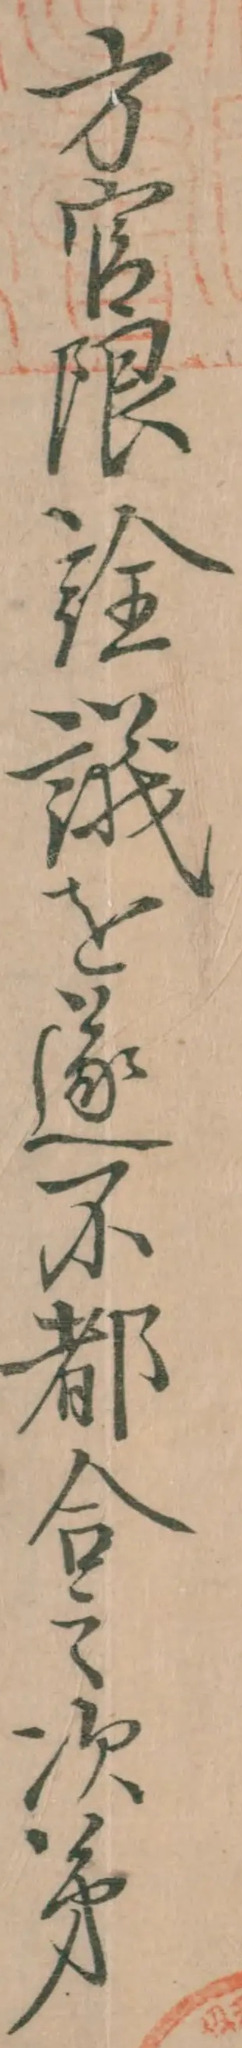方官限詮議を遂不都合之次第
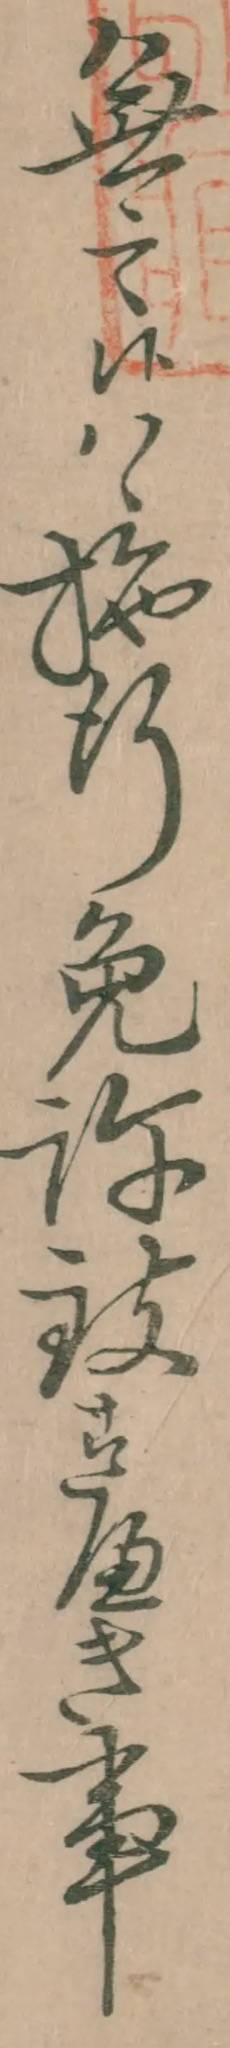無之候はゝ施行免許致すへき事
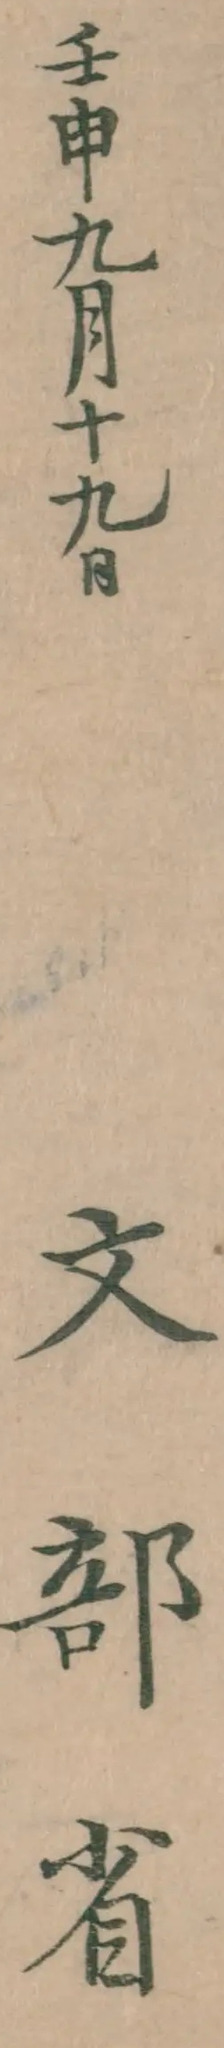壬申九月十九日文部省
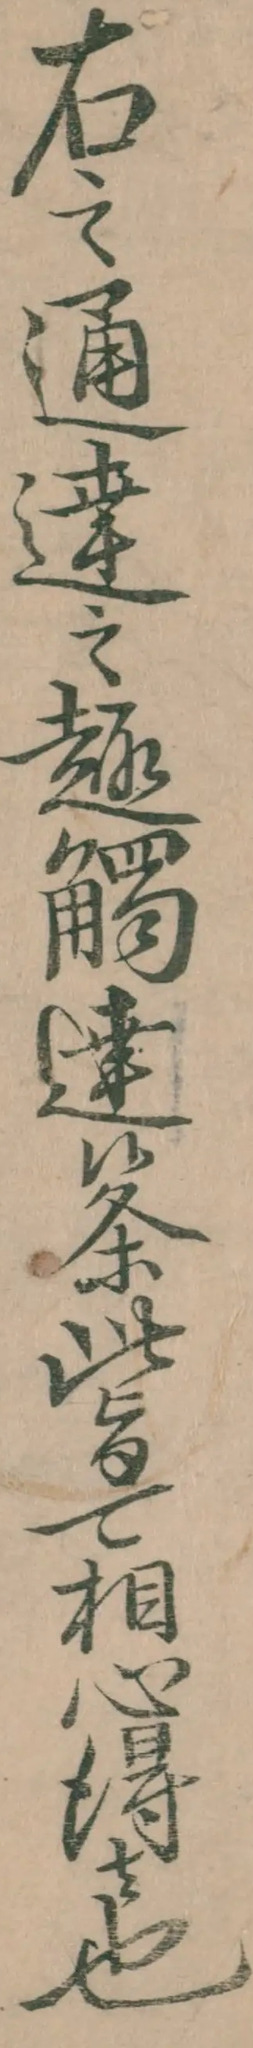右之通達之趣触達候条此旨て相心得は也
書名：種痘通達
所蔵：国立国会図書館 National Diet Library, JAPAN
